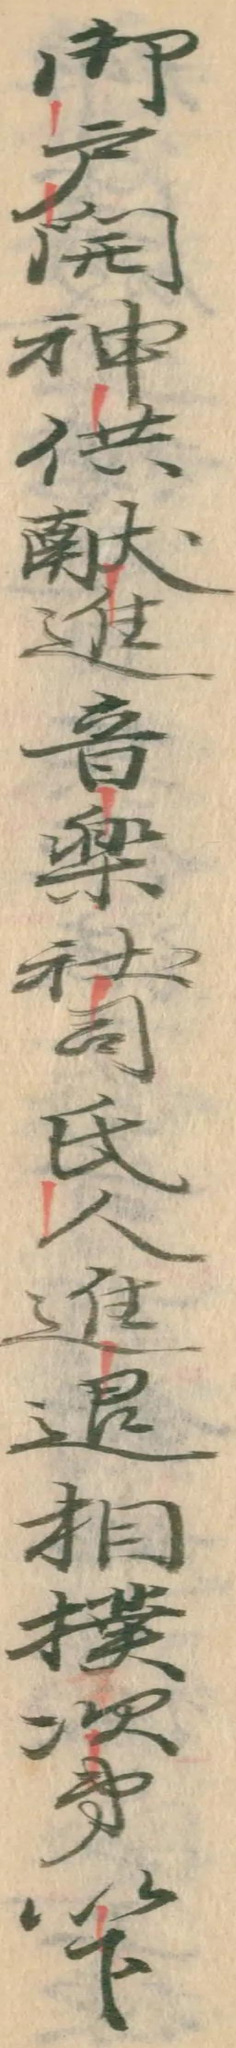御_戸_開神-供献-進音-楽社-司氏進-退相撲次-第以-下
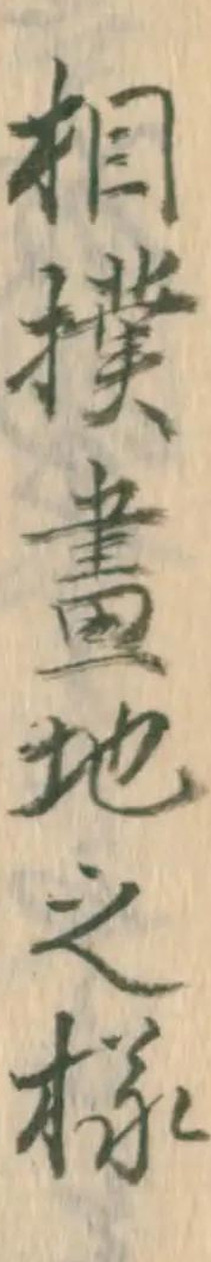相撲画地之様
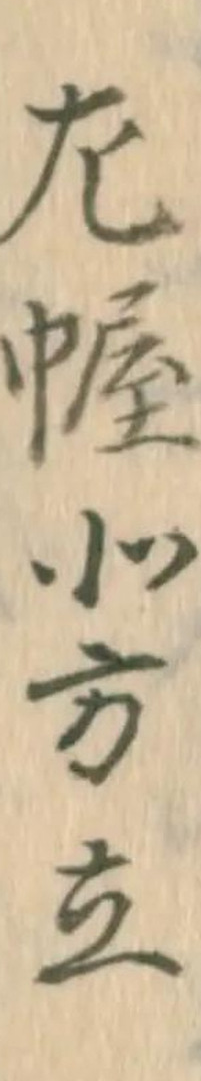左幄北方立
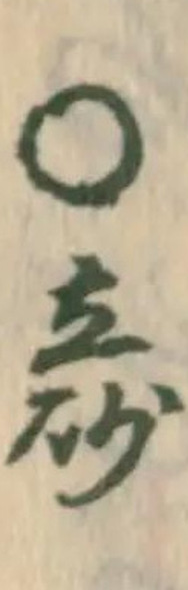○立砂
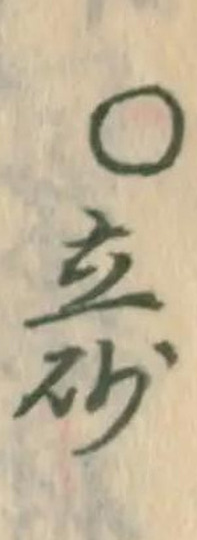○立砂

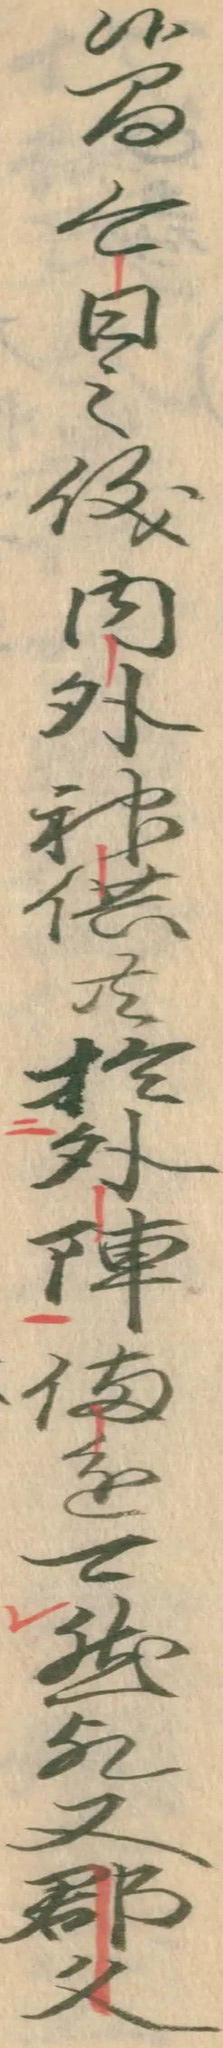候間今-日之儀内-外神-供共於外-陣備-進可然歟又郡久
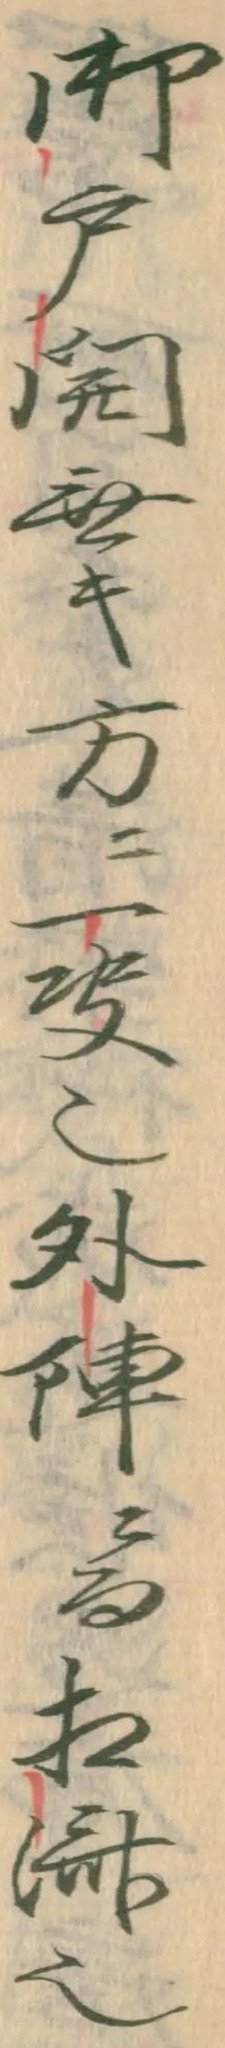御_戸_開無キ方ニ一-決也外-陣ニ而相_済也
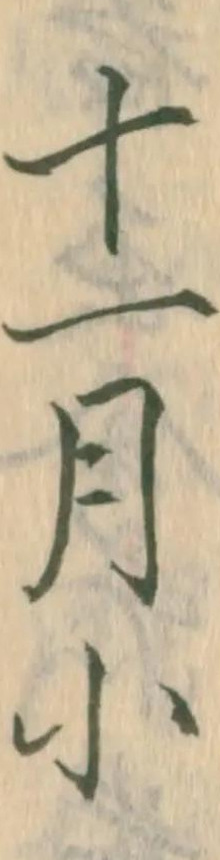十一月小
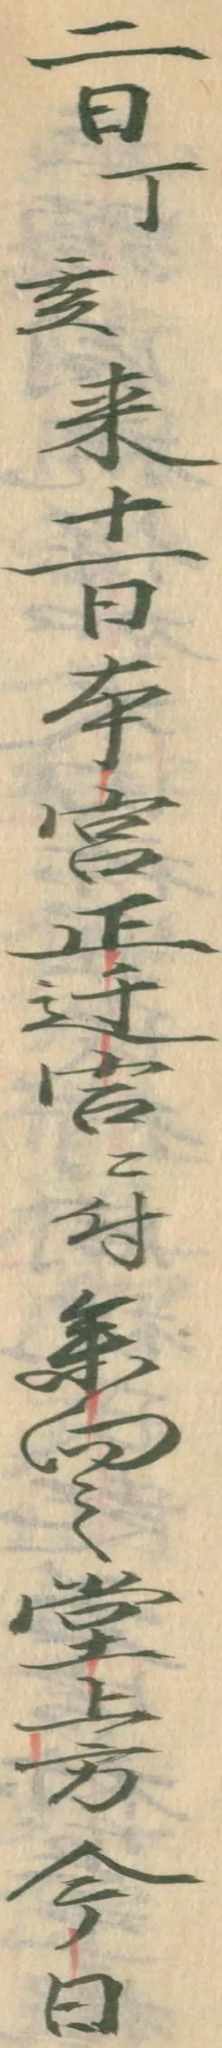二日丁亥来十一日本-宮正-迁-宮ニ付参-向之堂-上_方今-日

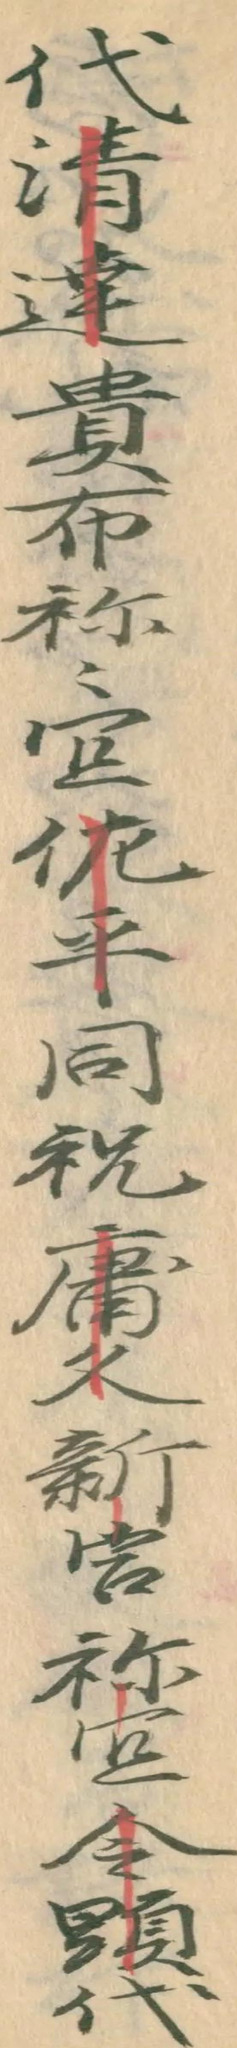代清達貴布祢々宜佐平同祝庸久新-宮祢-宜令顕代
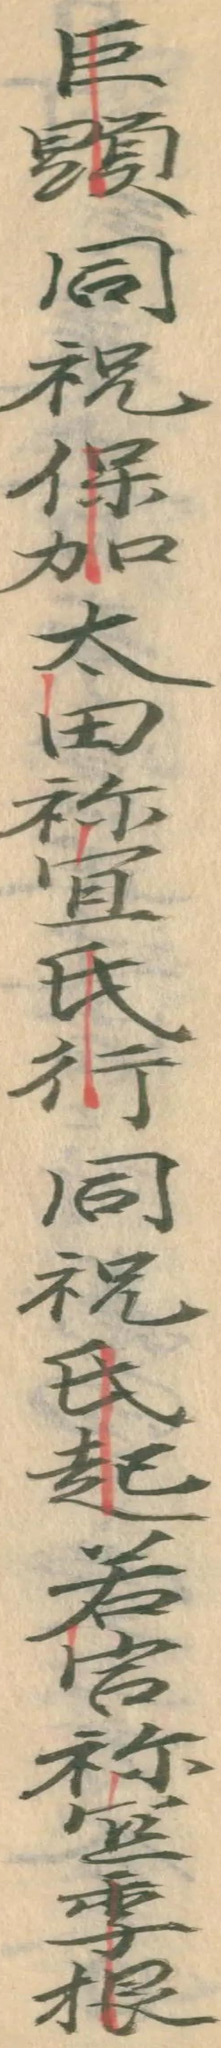巨顕同祝保加太_田祢-宜氏行同祝氏起若_宮祢-宜季根
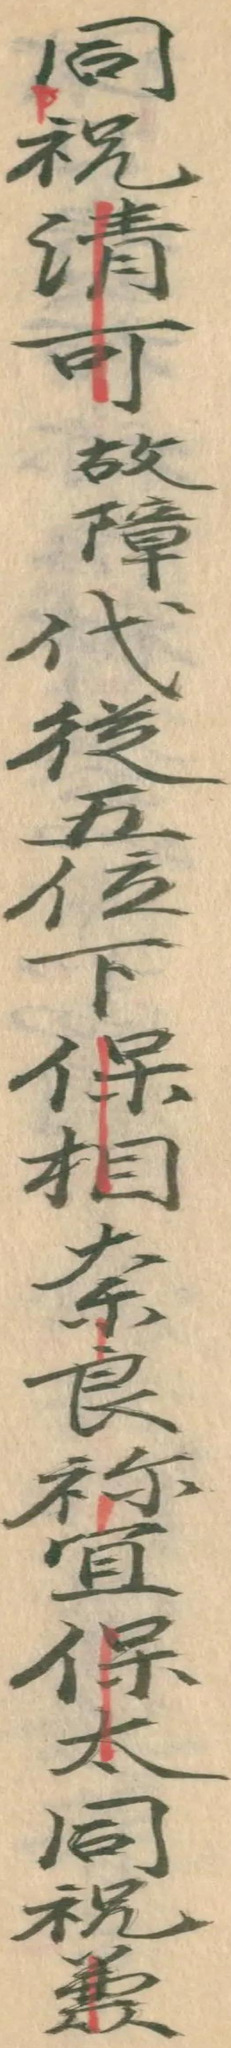同_祝清可故障代従五位下保相奈-良祢-宜保太同祝兼
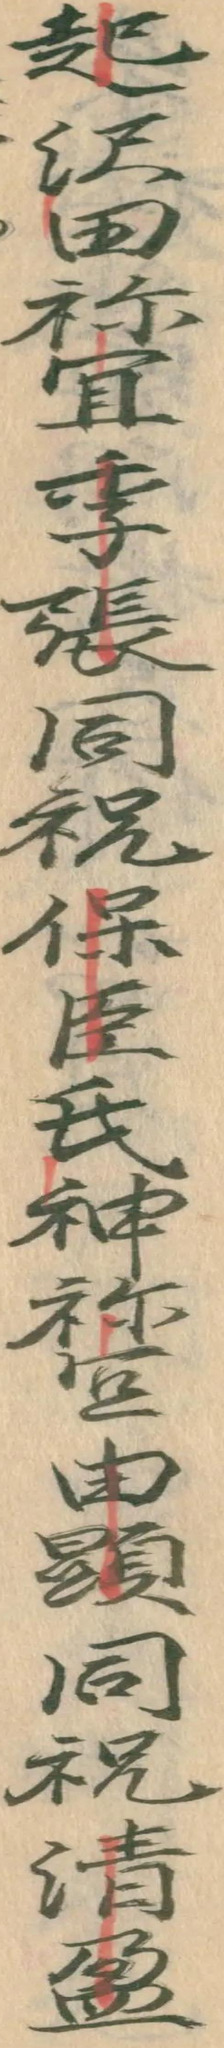起沢_田祢-宜季張同祝保臣氏_神祢-宜由顕同祝清盈
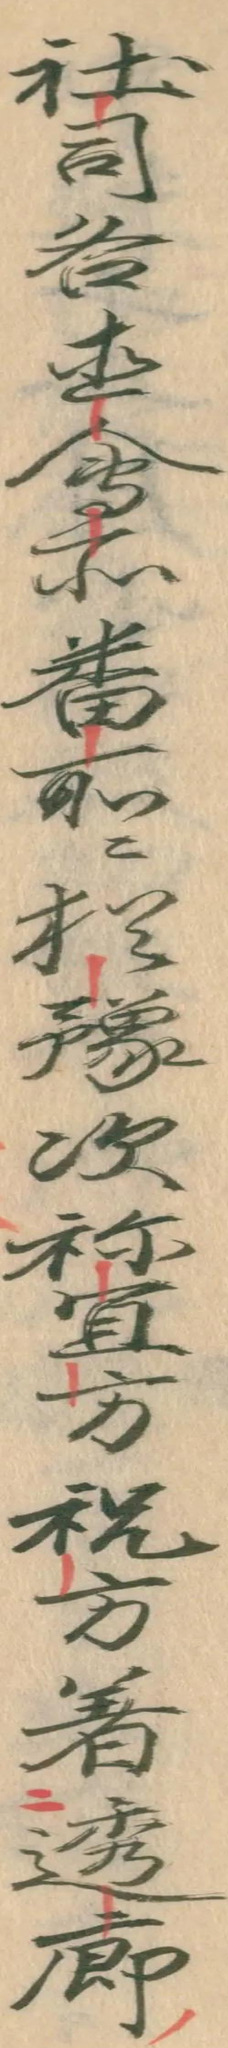社-司各直-会-所番-所ニ猶-予次祢-宜_方祝_方着透-廊

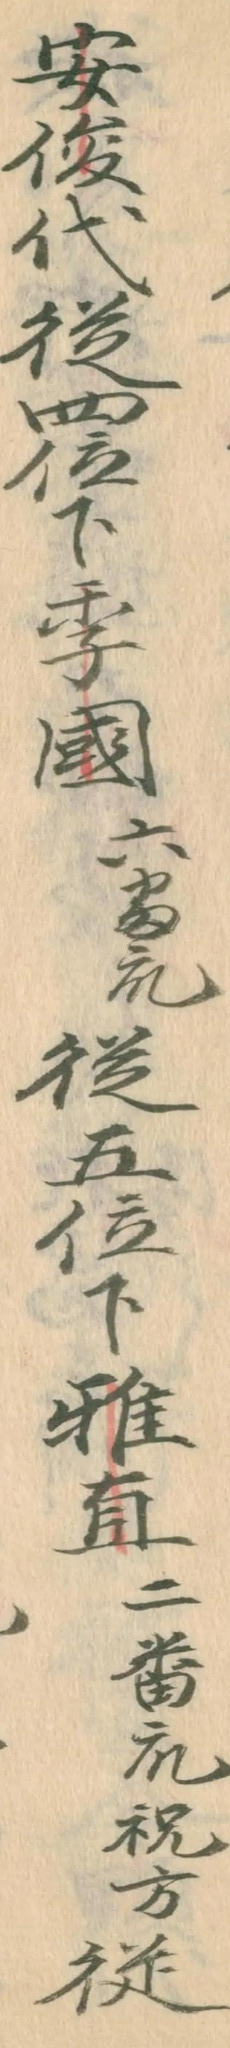安俊代従四位下季国六番衆従五位下雅直二番衆祝方従
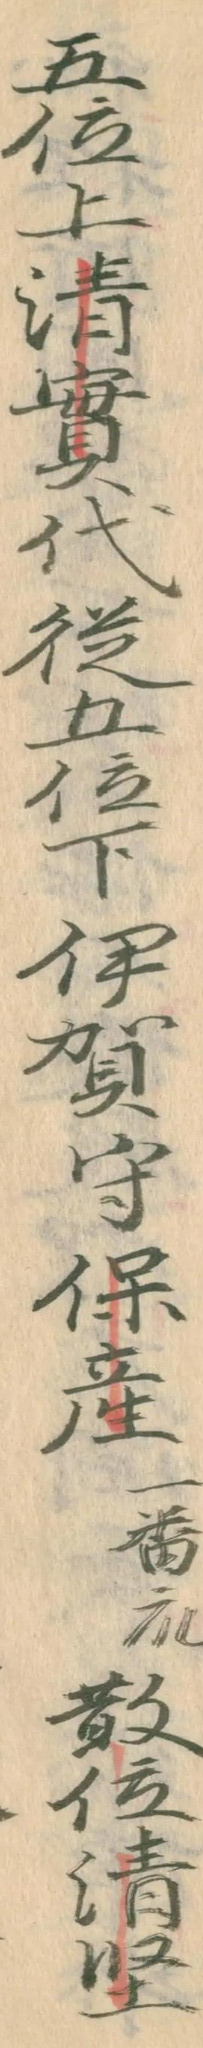五位上清実代従五位下伊賀守保産一番衆散-位清堅
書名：賀茂社記録. 第16冊
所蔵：国立国会図書館 National Diet Library, JAPAN
